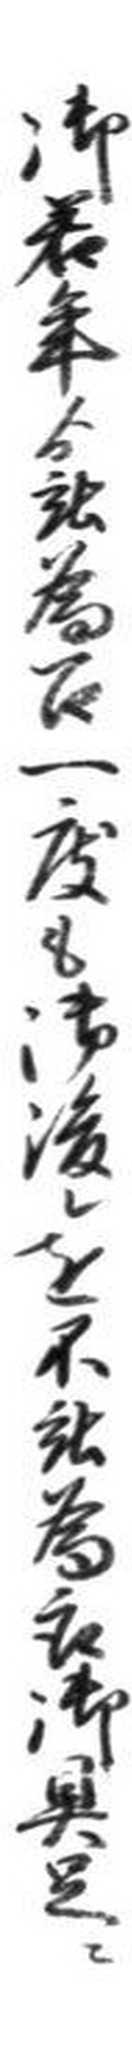御若年ゟ被為召一度も御後レを不被為取御具足ニ
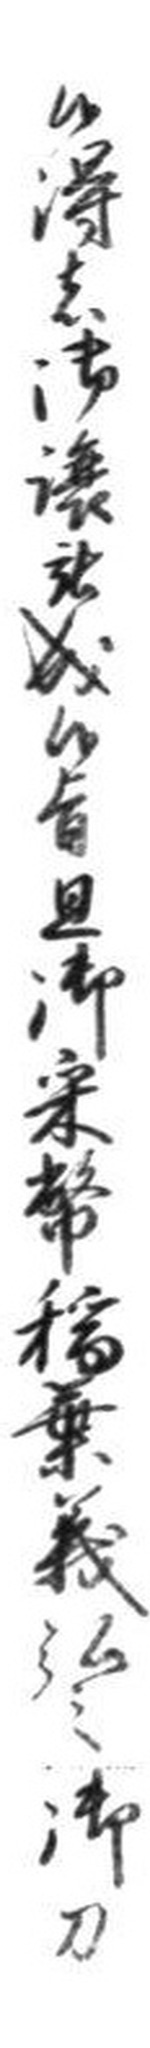候得者御譲被成候旨且御采幣稲葉義弘之御刀
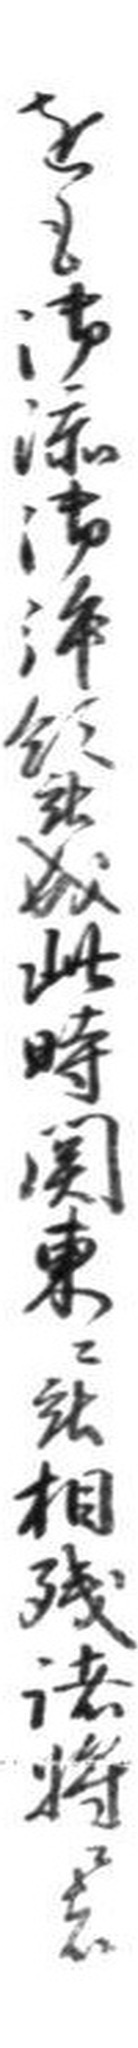をも御添御拝領被成此時関東ニ被相残諸将ニ者
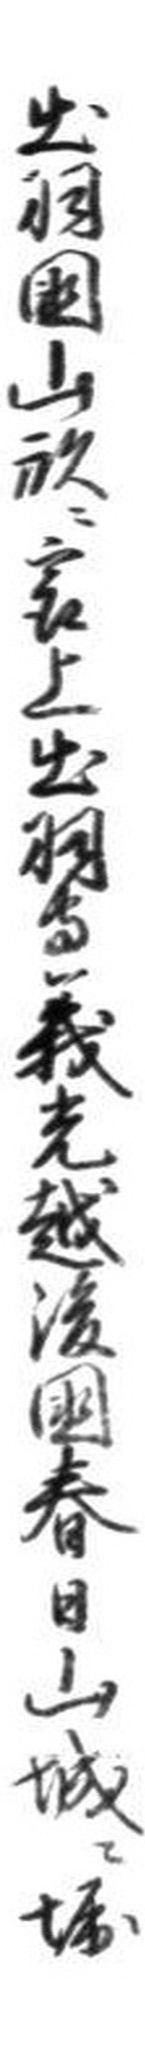出羽国山形ニ最上出羽守義光越後国春日山城ニ堀
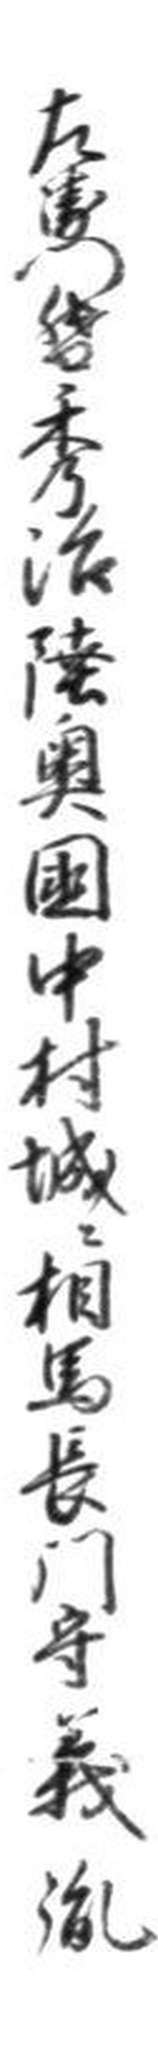左衛門督秀治陸奥国中村城ニ相馬長門守義胤
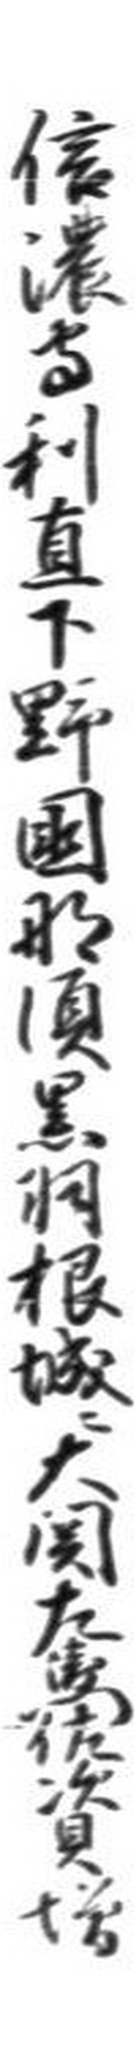信濃守利直下野国那須黒羽根城ニ大関左衛門佐資増
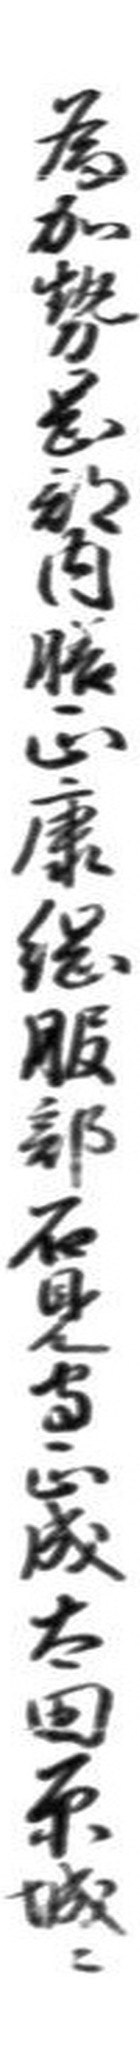為加勢岡部内膳正康綱服部石見守正成太田原城ニ
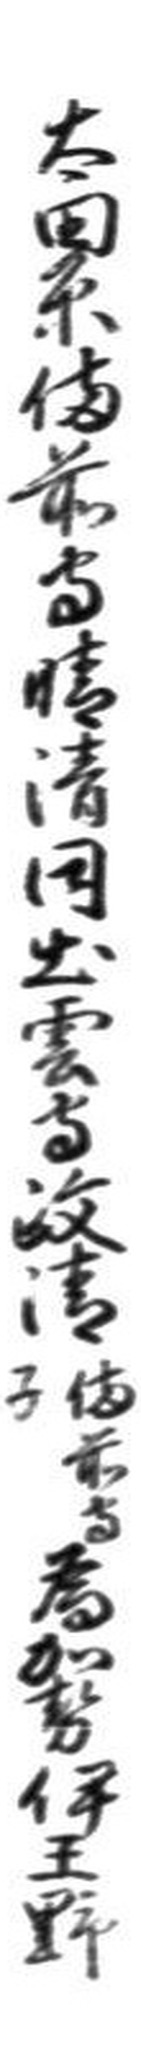太田原備前守晴清同出雲守政清備前守子為加勢伊王野
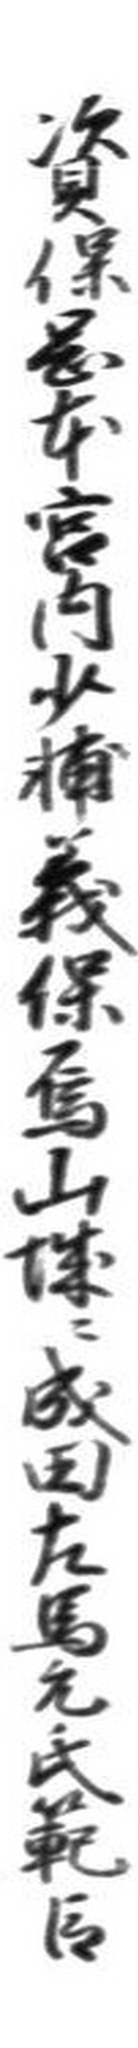資保岡本宮内少輔義保烏山城ニ成田左馬允氏範臣
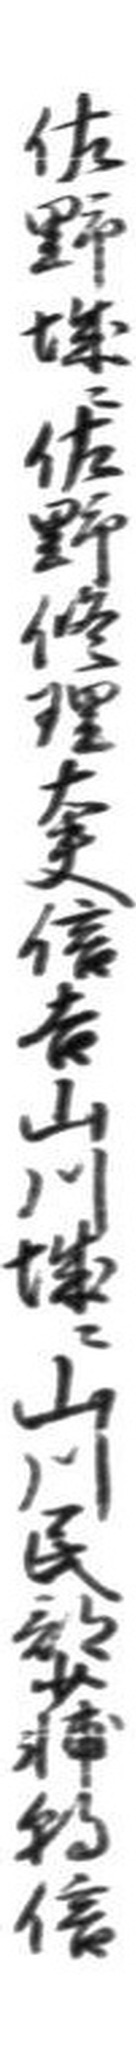佐野城ニ佐野修理大夫信吉山川城ニ山川民部少輔朝信
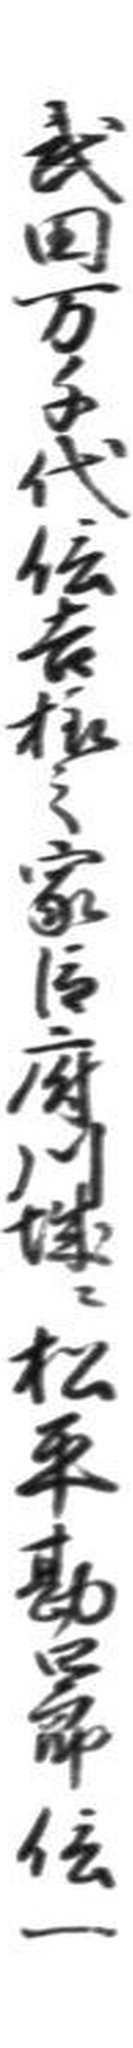武田万千代信吉様之家臣府川城ニ松平勘四郎信一

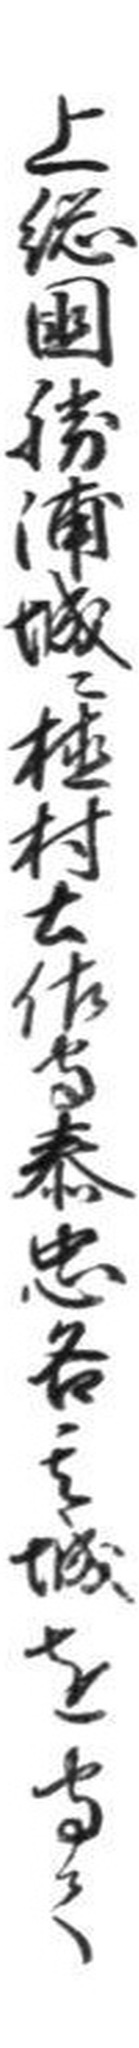上総国勝浦城ニ植村土佐守泰忠各其城を守て
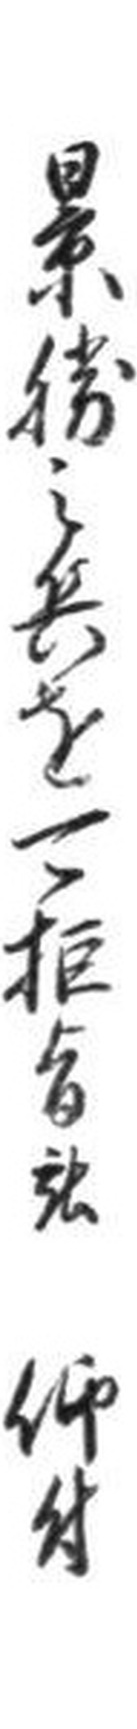景勝之兵を可拒旨被仰付
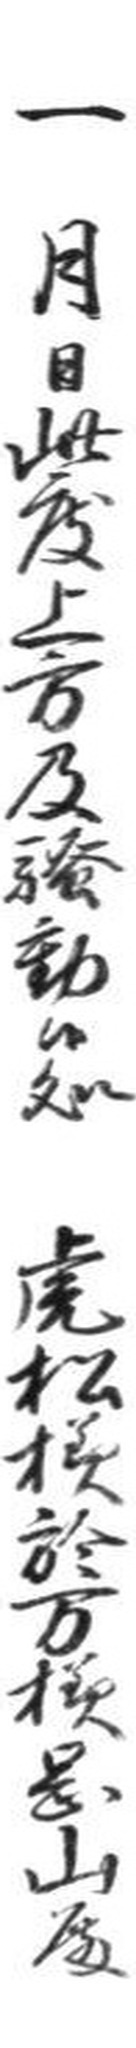一月日此度上方及騒動候処虎松様於万様岡山殿
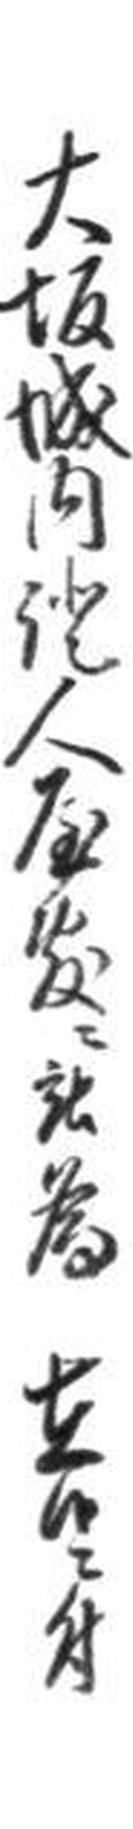大坂城内証人屋敷ニ被為在候ニ付
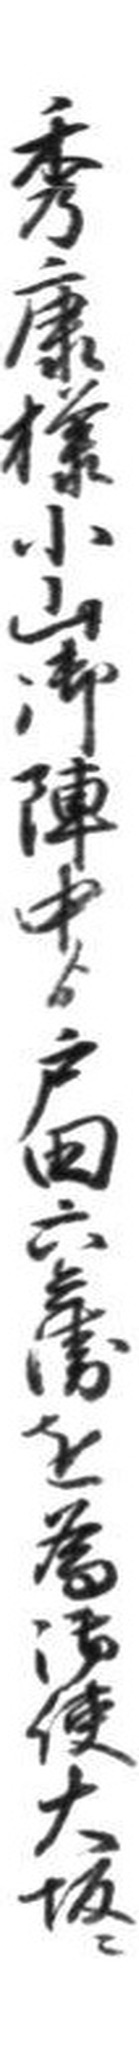秀康様小山御陣中ゟ戸田六兵衛を為御使大坂ニ
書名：家譜 一 秀康公 従天正二年到慶長十二年
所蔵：福井県文書館 Fukui Prefectural Archives
